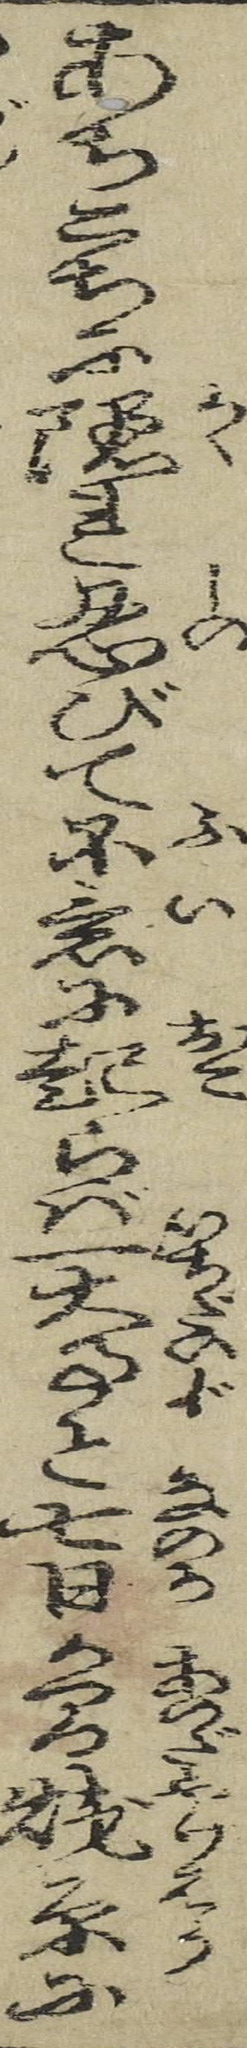あちこちに隠れ忍びて不意に起らば一大事と七日か間焼原に
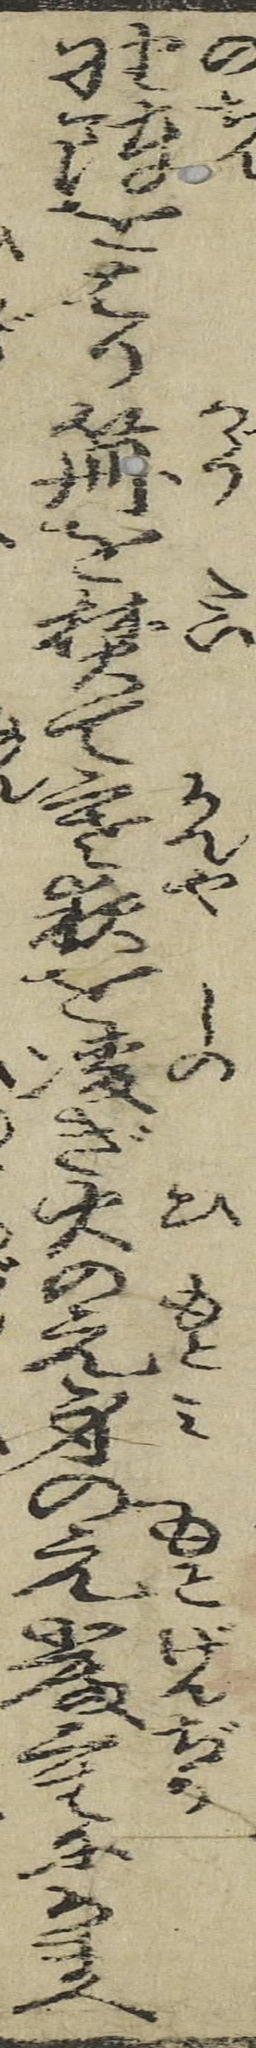野陣をはり篝を焚て寒夜を凌ぎ火の元身の元厳重にかまへ
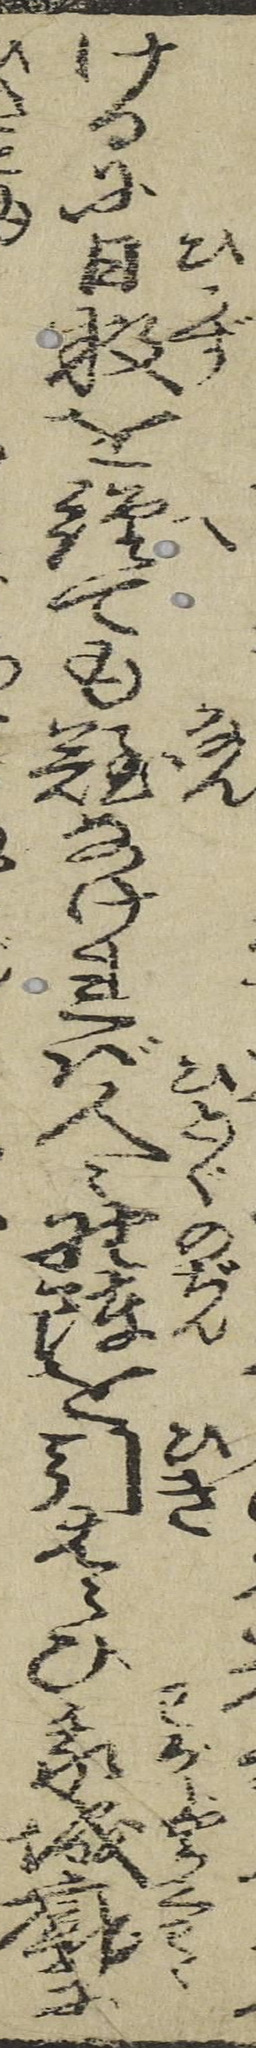けるに日数を経ても難なければ人々野陣を引はらひ我城郭に
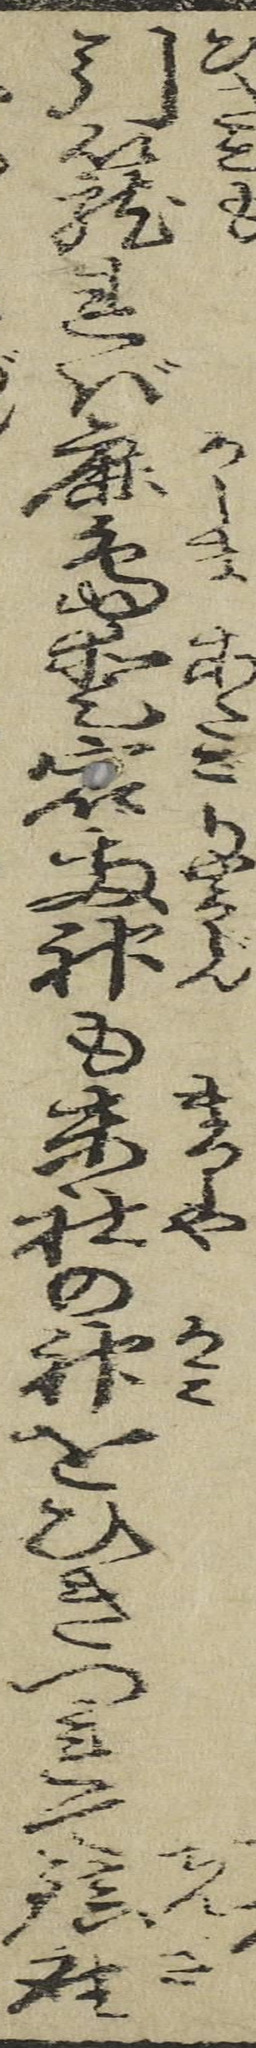引籠れば鹿島愛宕両神も末社の神をひきつれて鎮座
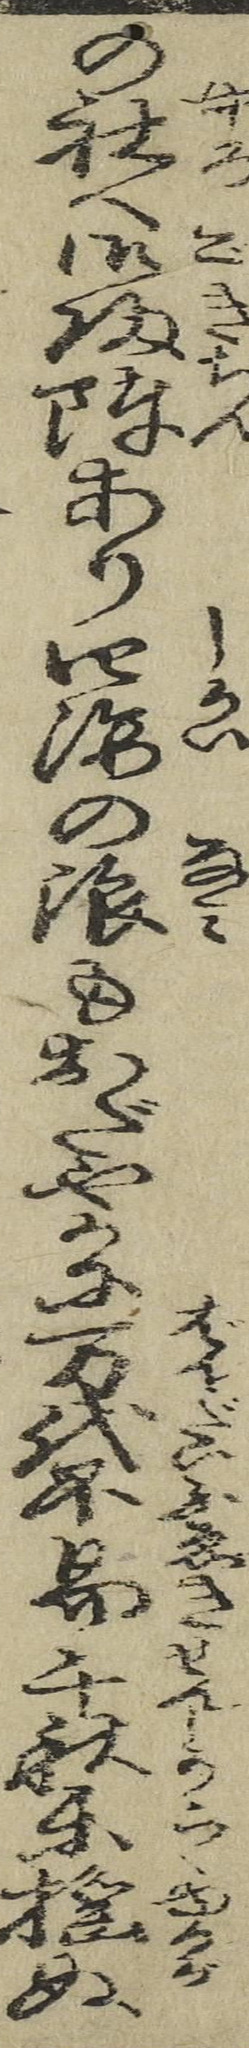の社へ御帰陣あり四海の浪もおだやかに万代不易千秋楽揺ぬ

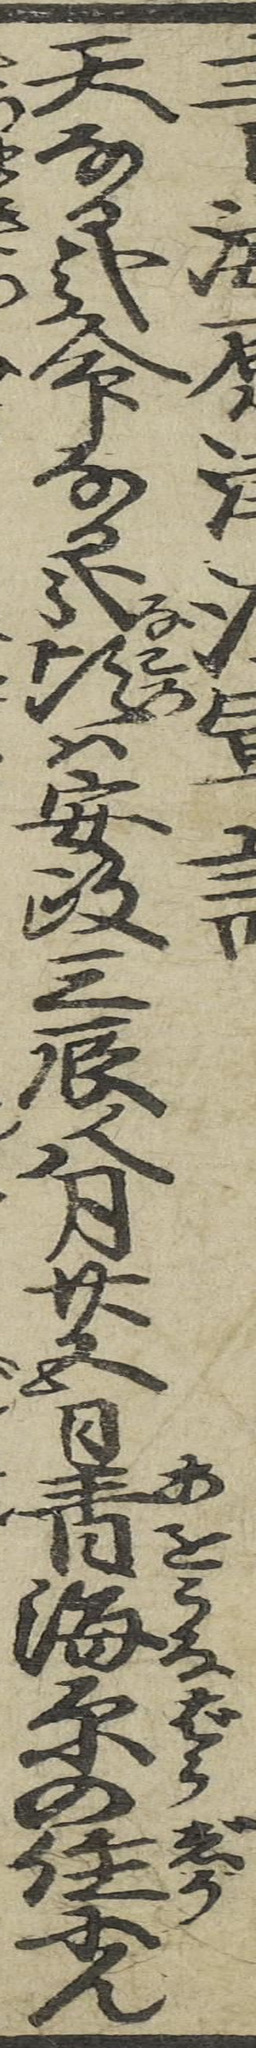天なる哉命なる哉頃は安政三辰ノ八月廿五日青海原の住にん
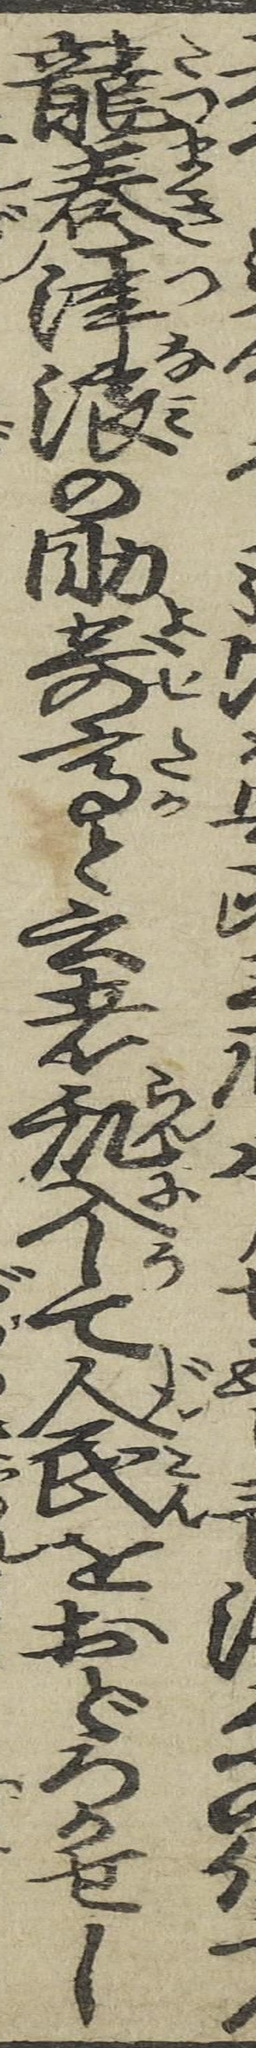竜巻津浪の助寄高と云者乱入して人民をおどろかせし
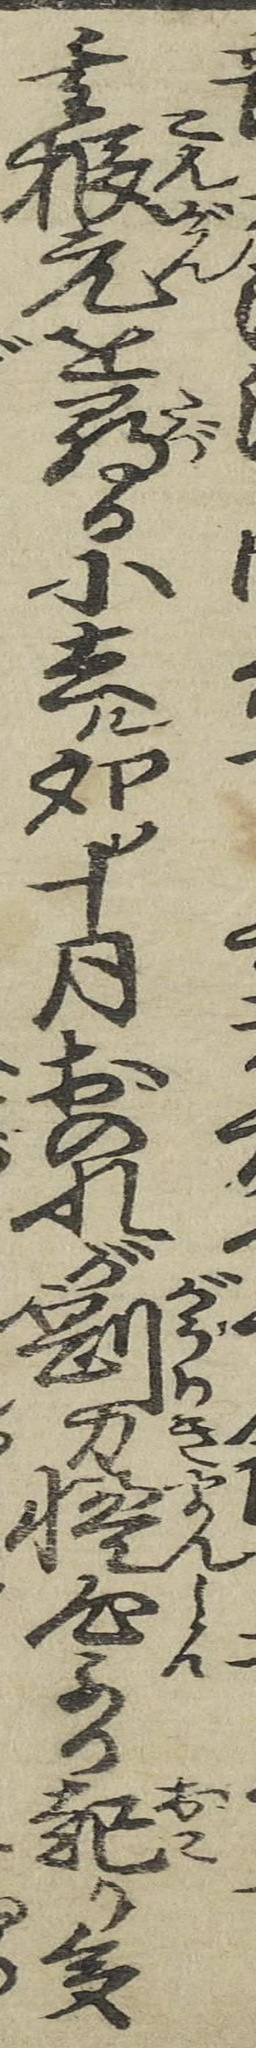其根元を尋るに去ㇽ卯十月おのれが剛力慢心より起り多
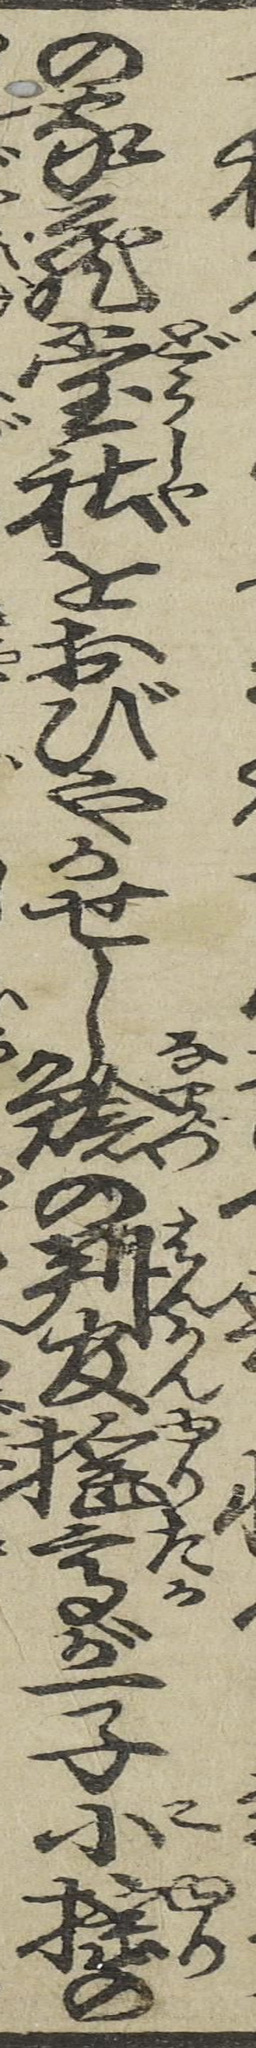の家蔵堂社をおびやかせし鯰の判官揺高が一子小揺の
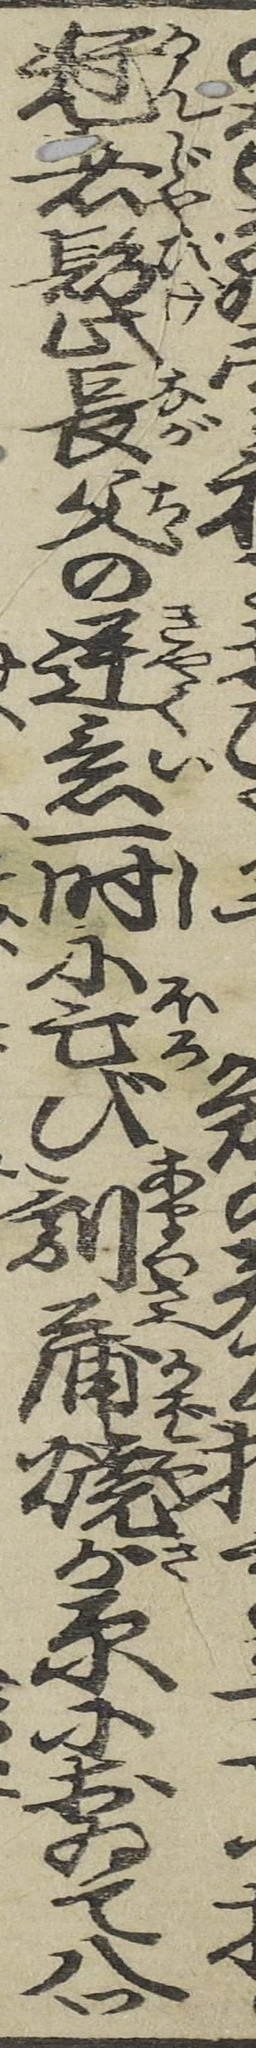冠者髭長父の逆意一時に亡び剰蒲焼が原におゐて八ッ
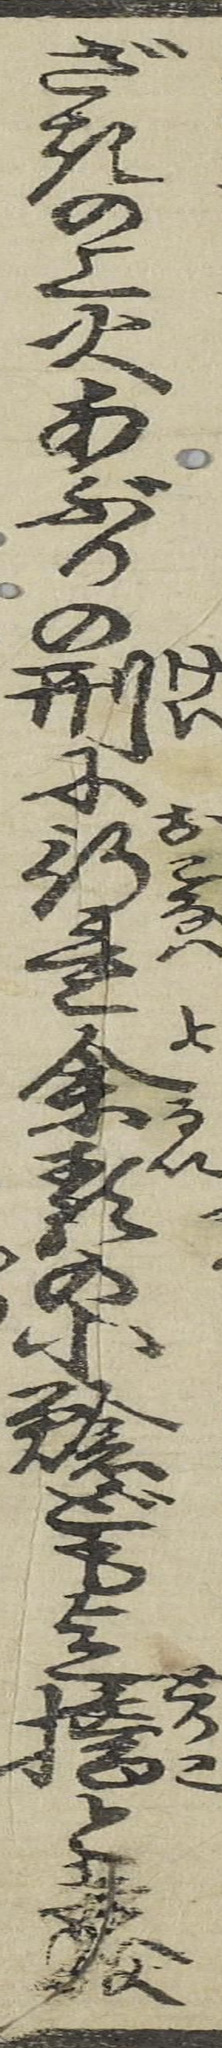ざきの上火あぶりの刑に行れ余類の小鯰ども迄虜と相成
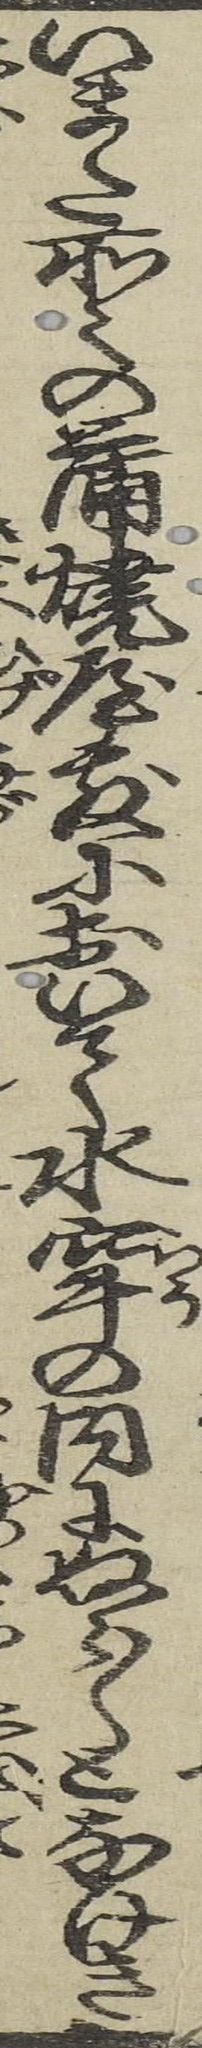いまた所々の蒲焼屋敷において水牢の内にぬら〳〵となけき
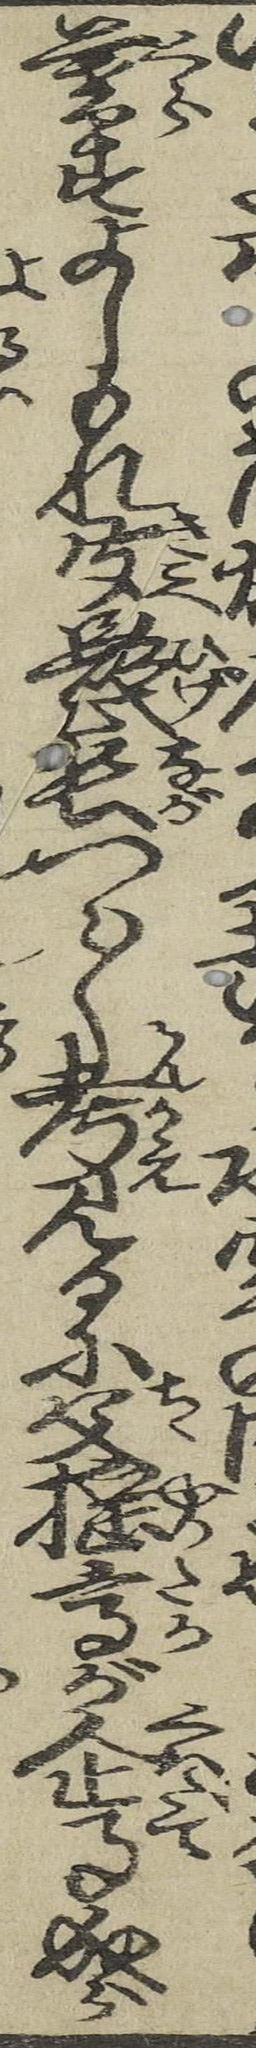暮すよしもれ聞髭長つら〳〵考見るに父揺高が企事成ら
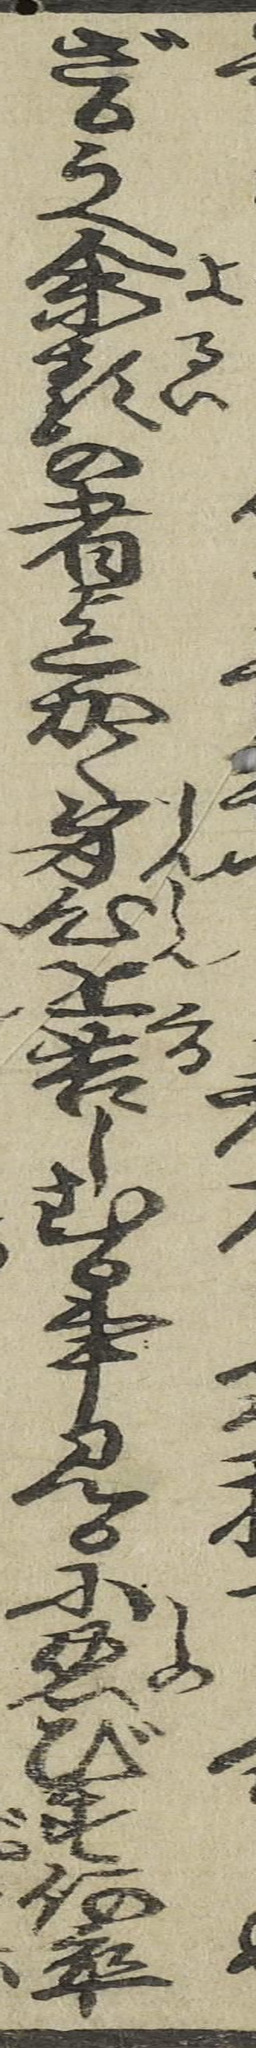ざるうへ余類の者迄かく身心を苦しむる事見るに忍びす何卒
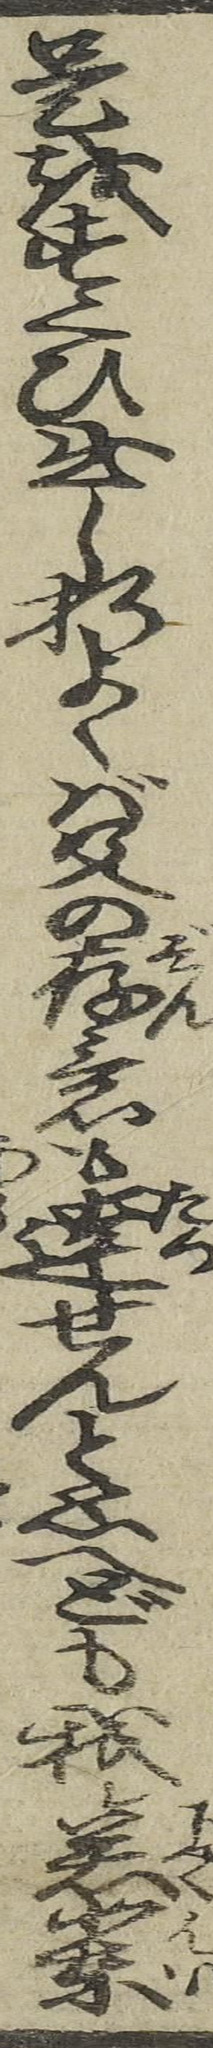是をすくひ出し折よくば父の存意も達せんと思へども我レ若輩
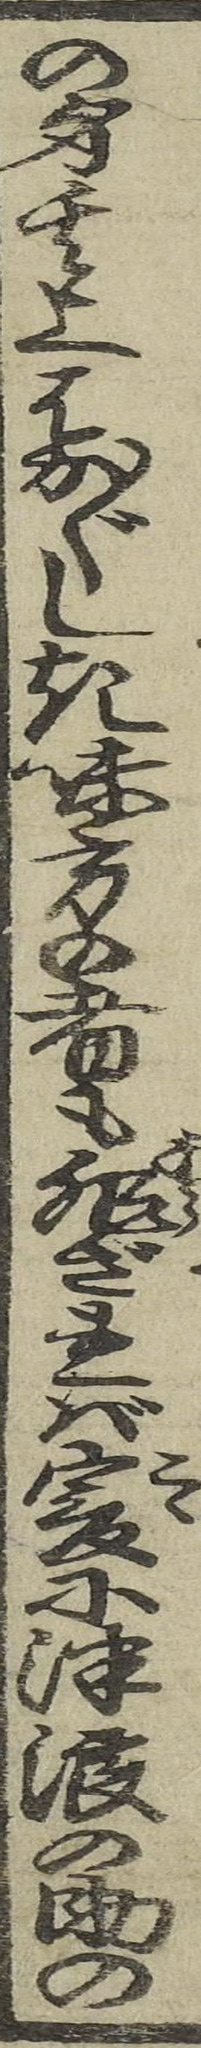の身其上はか〴〵じき味方の者も有ざれば爰に津浪の助の
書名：安政大地震畧記　全
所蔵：東京大学地震研究所図書室 Earthquake Research Institute Library, The University of Tokyo, JAPAN
